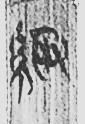緅
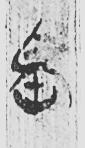{鬼山}（魏）
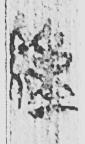{糸軎}
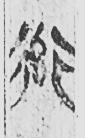率
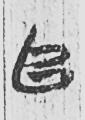𠂤
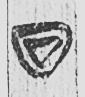回
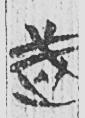武
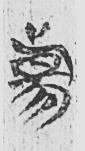{㫃昜}
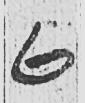㠯（以）
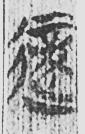復
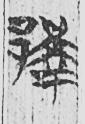{口幸阝}
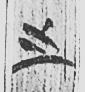之
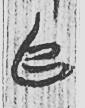𠂤
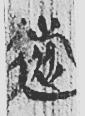{辶旅}
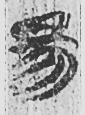昜
